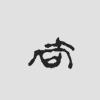尙
